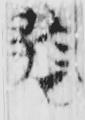陰
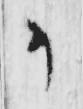人
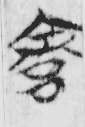舒
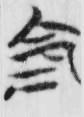命
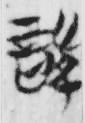○（證）
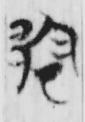陰
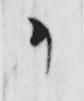人
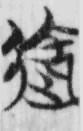御
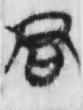君
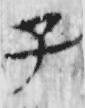子
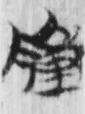○（陳）
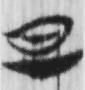旦
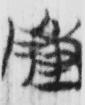○（陳）
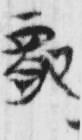龍
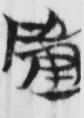○（陳）
